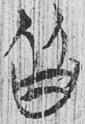皆（偕）
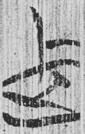上B
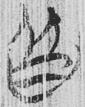皆（偕）
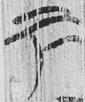下
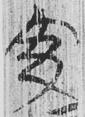交交
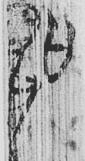鳴
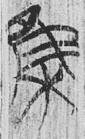集
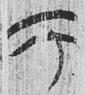于
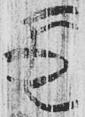𠁩
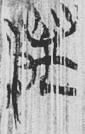澫（瀨）
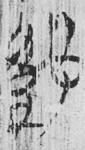○（愷）
